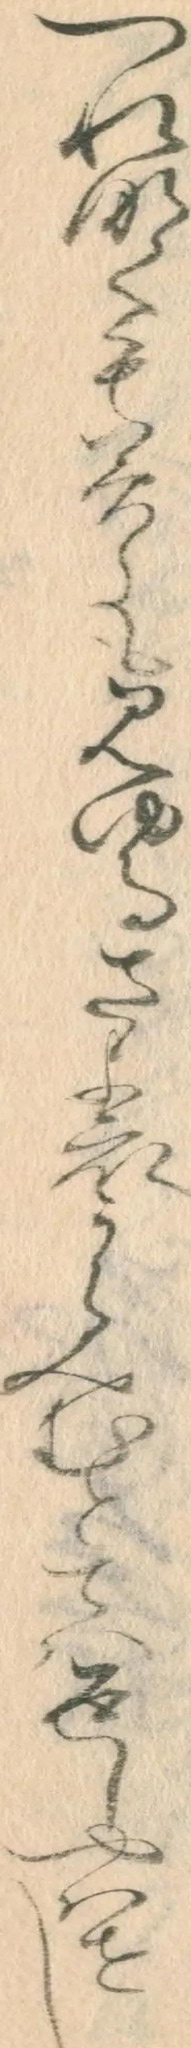つれなくも夢にも見ゆるさよ衣うらみむとては返しやはせし
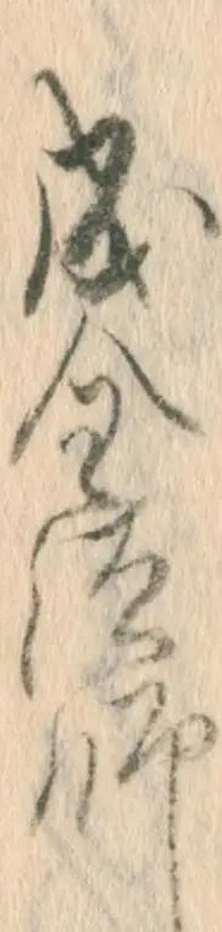成全源師
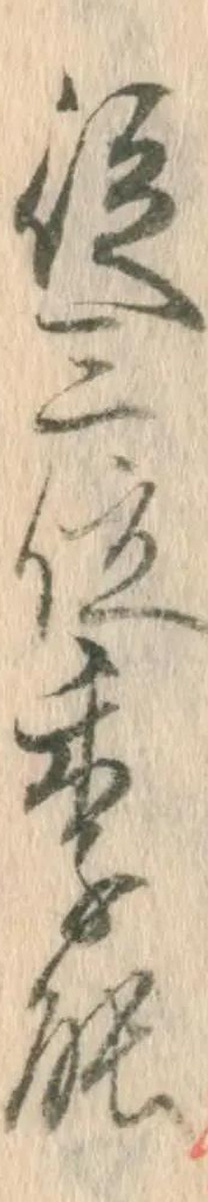従三位季能
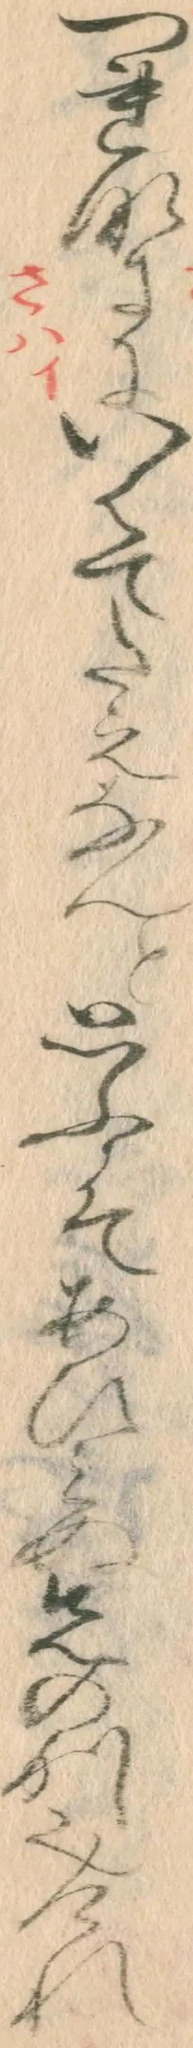つれなきにいはてたえなんと思ふこそあひみぬ先の別也けれ
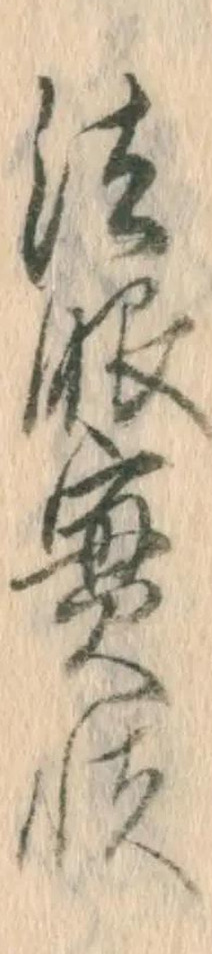法眼実快
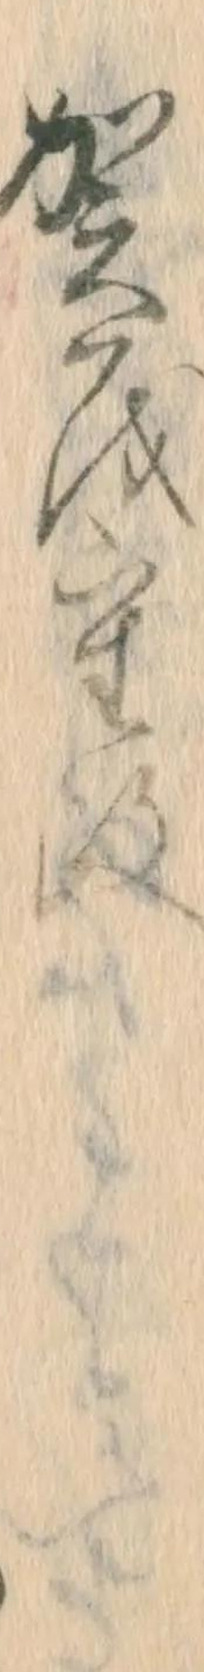賀茂重政
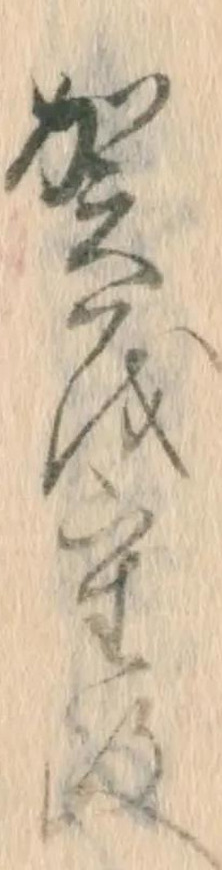賀茂重政
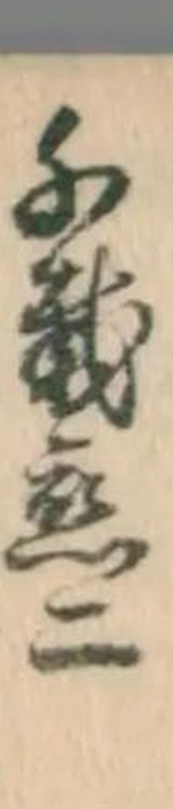千載恋二
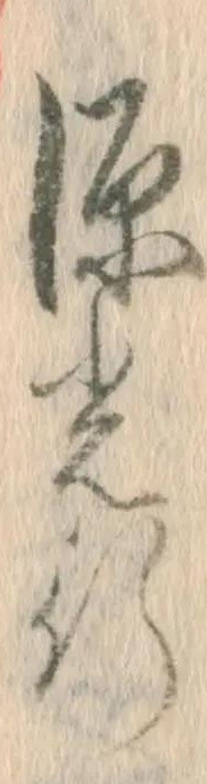源光行
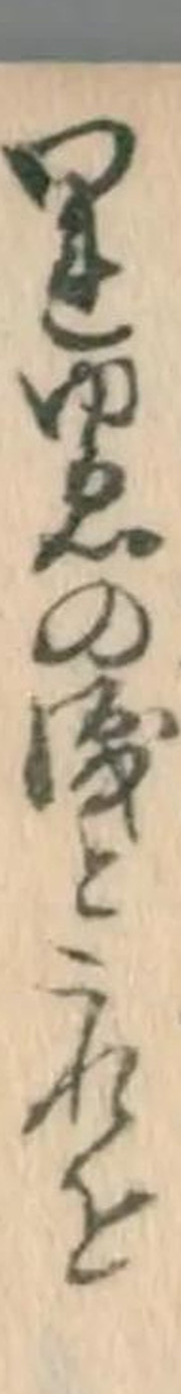われゆゑの涙とこれを
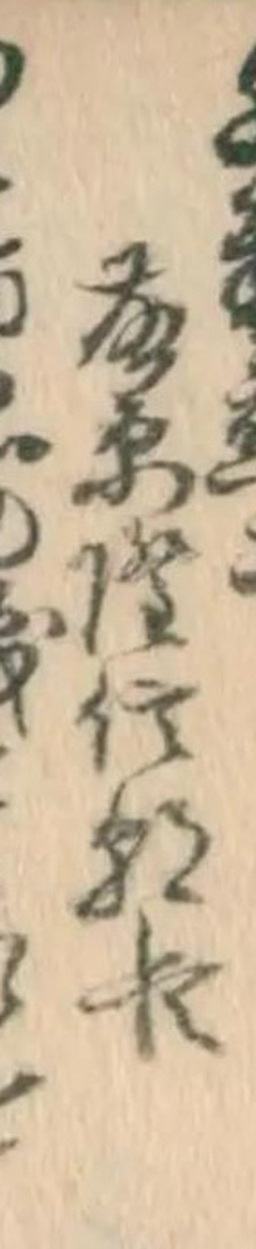藤原隆信朝臣
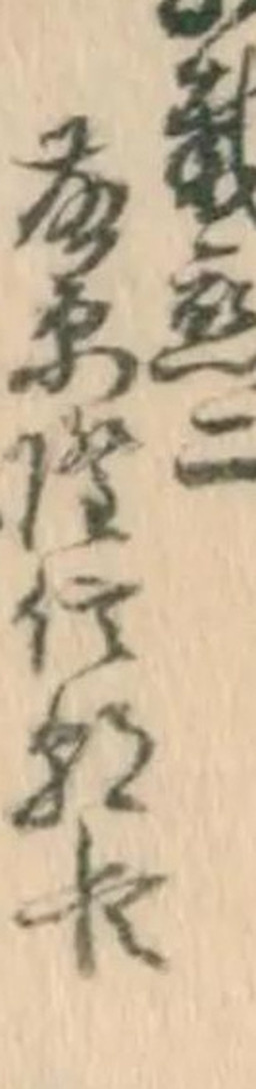藤原隆信朝臣
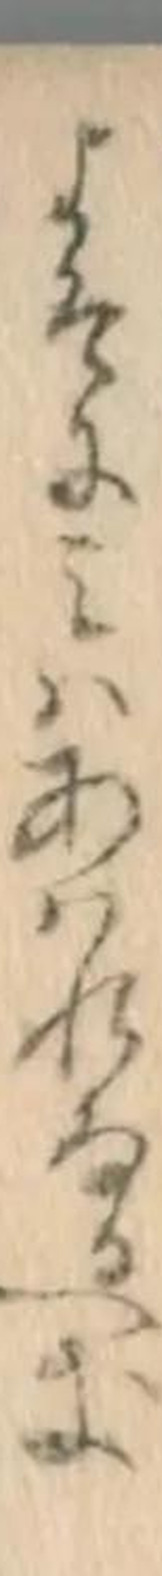よそにみはあはれなるへき
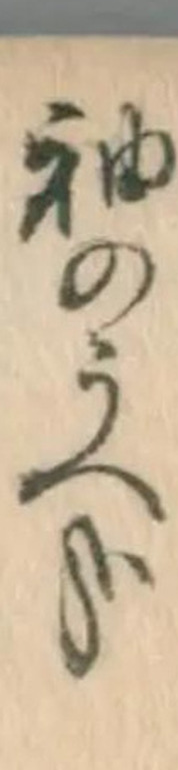袖のうへ哉
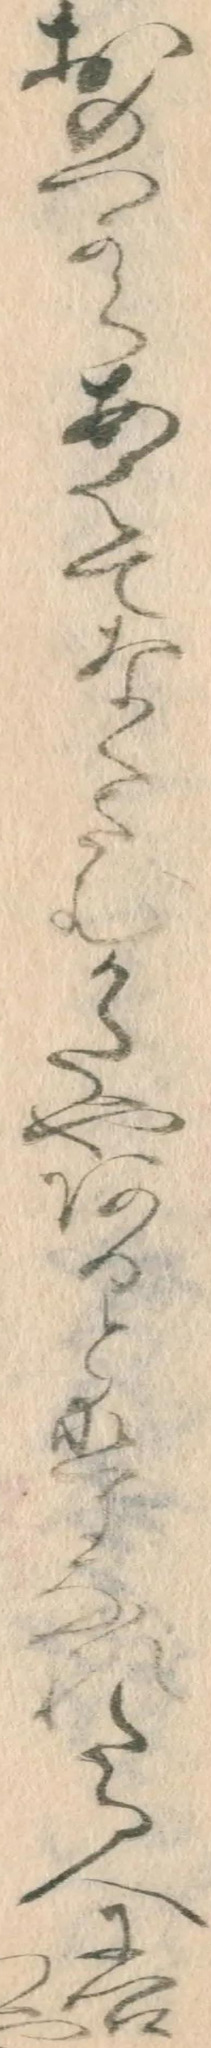おのつからあはてなくさむかたやあると恋になれたる人に問はや
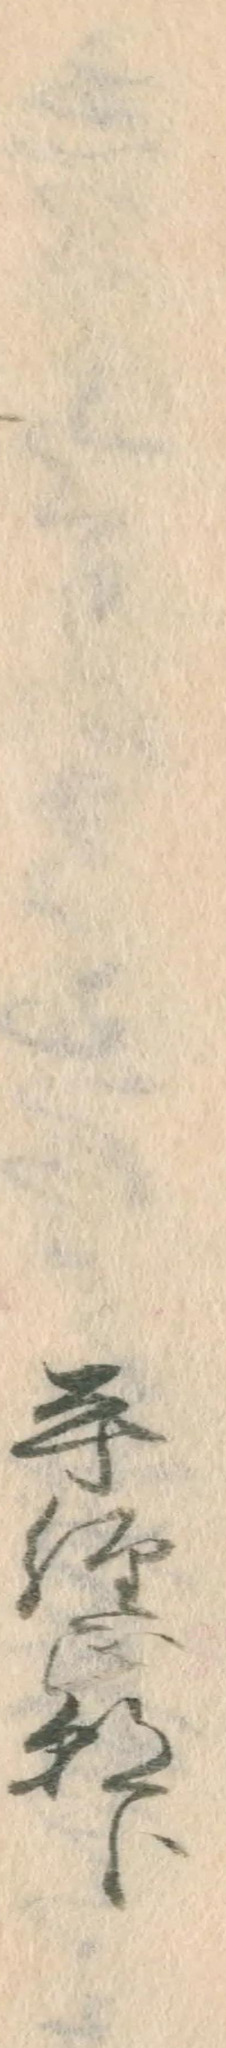平経正朝臣
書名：月詣和歌集
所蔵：国立国会図書館 National Diet Library, JAPAN
